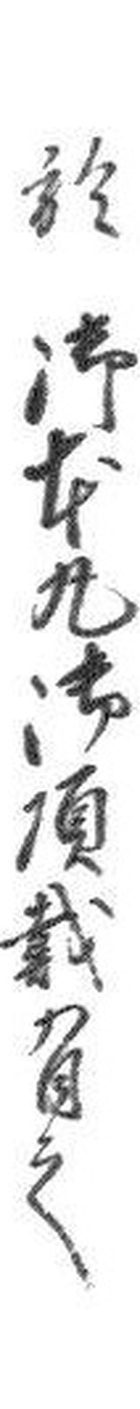於御本丸御頂戴有之
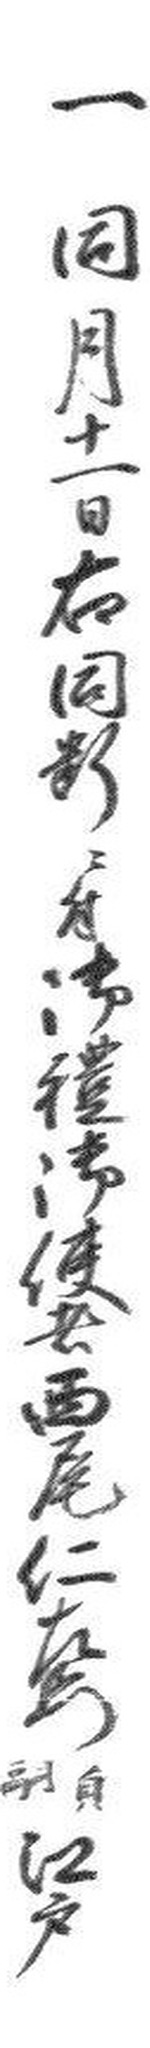一同月十一日右同断ニ付御礼御使者西尾仁左衛門貞嗣江戸
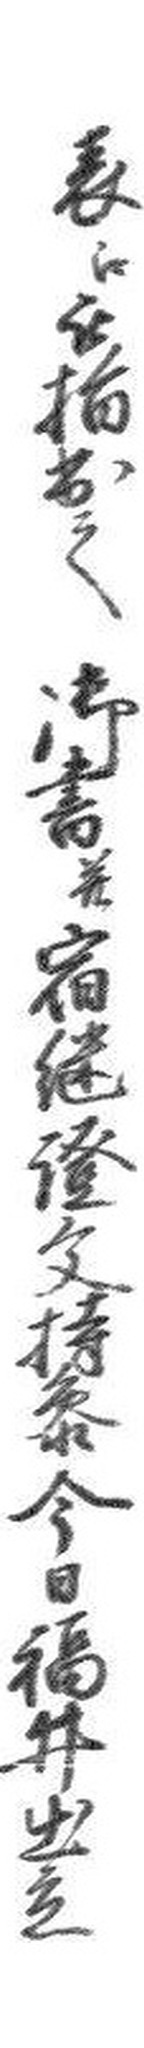表江被指出之御書并宿継証文持参今日福井出立
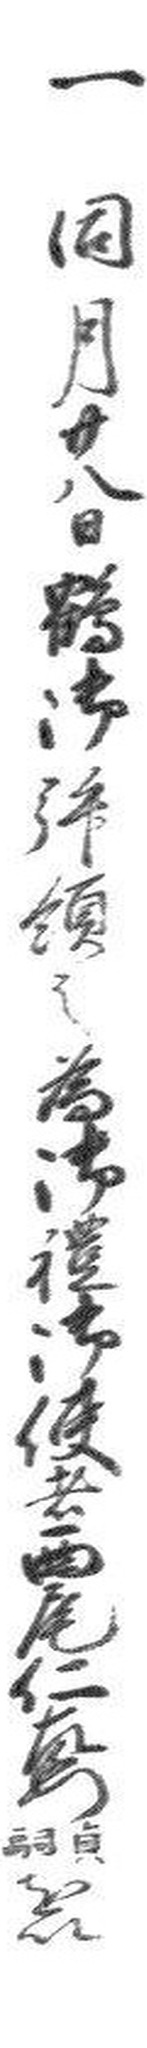一同月廿八日鶴御拝領之為御礼御使者西尾仁左衛門貞嗣を以
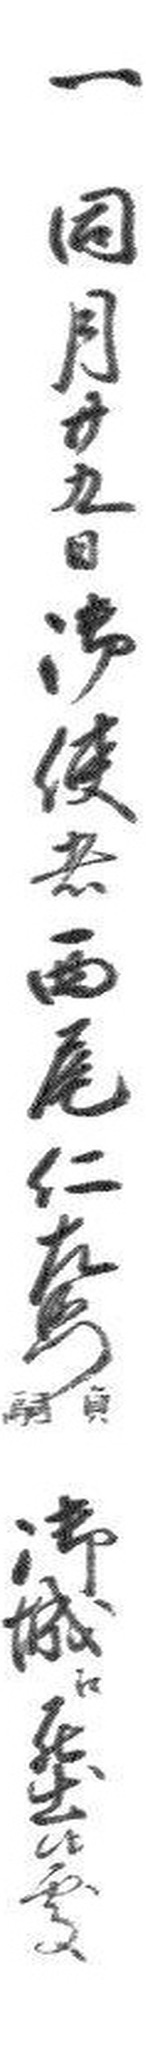一同月廿九日御使者西尾仁左衛門貞嗣御城江罷出候処
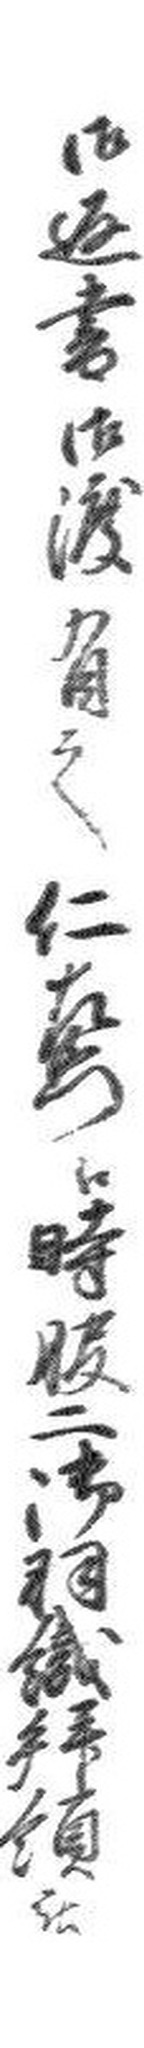御返書相渡有之仁左衛門江時服二御羽織拝領被

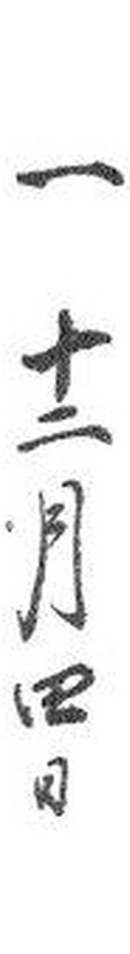一十二月四日
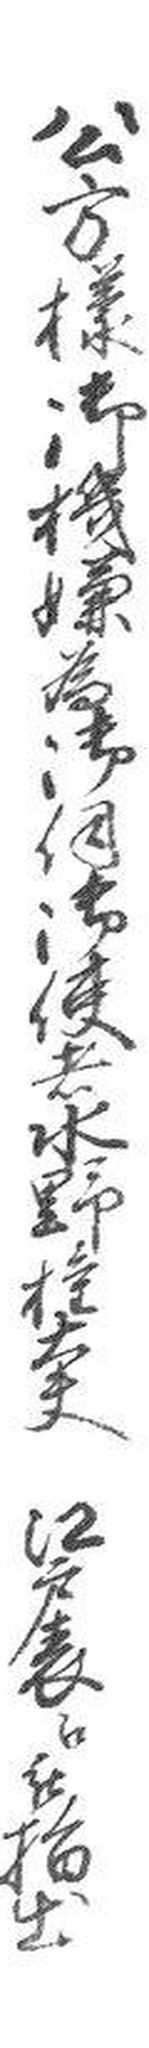公方様御機嫌為御伺御使者水野権大夫江戸表江被指出
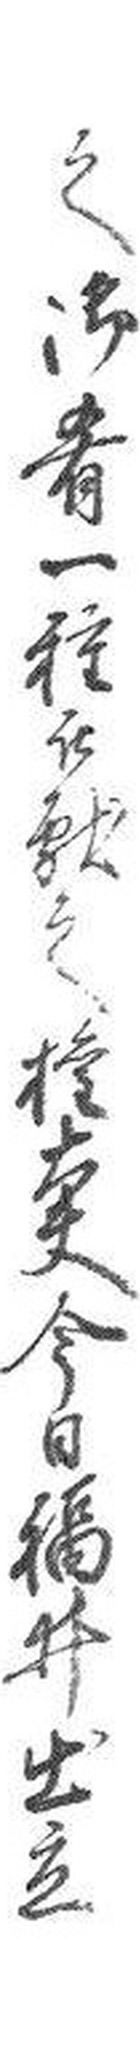之御肴一種被献之権大夫今日福井出立
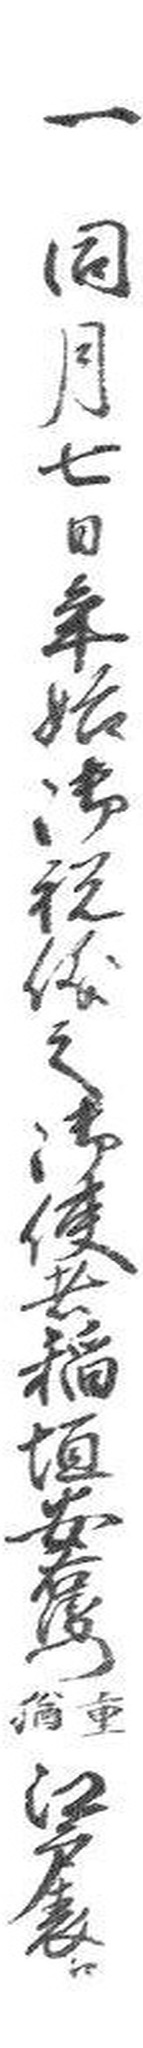一同月七日年始御祝儀之御使者稲垣安右衛門重猶江戸表江
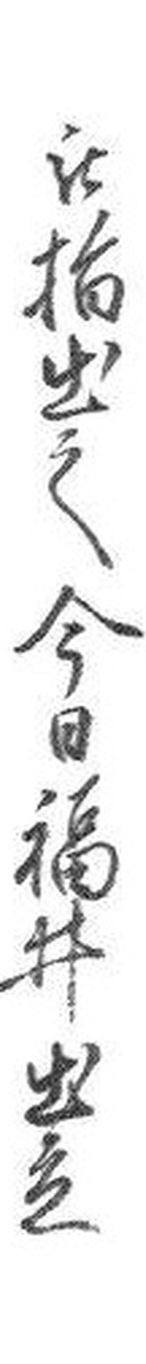被指出之今日福井出立
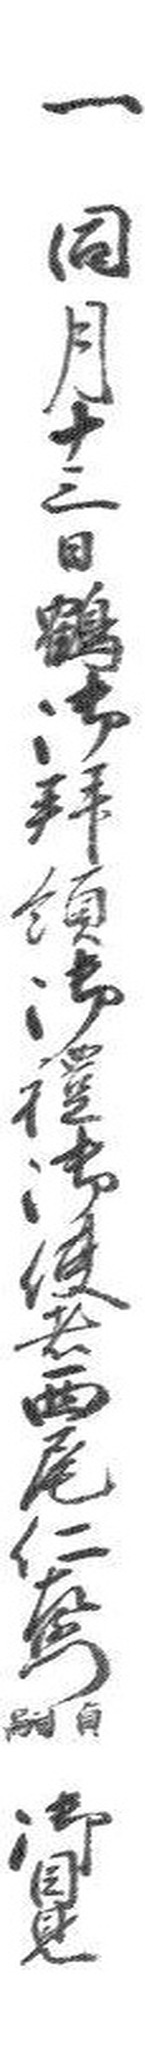一同月十三日鶴御拝領御礼御使者西尾仁左衛門貞嗣御目見
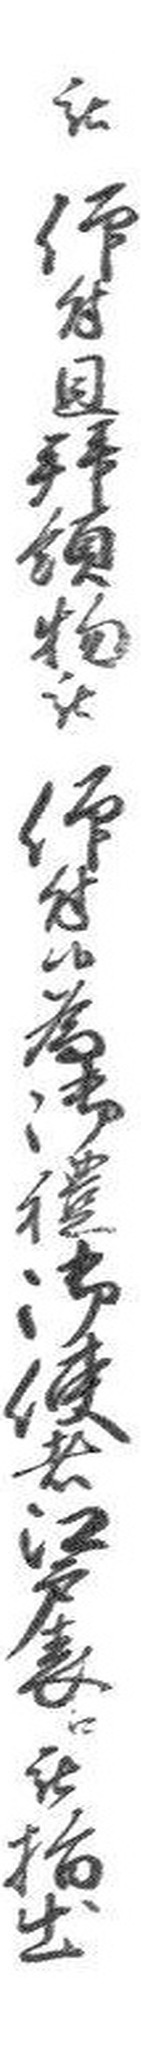被仰付且拝領物被仰付候為御礼御使者江戸表江被指出
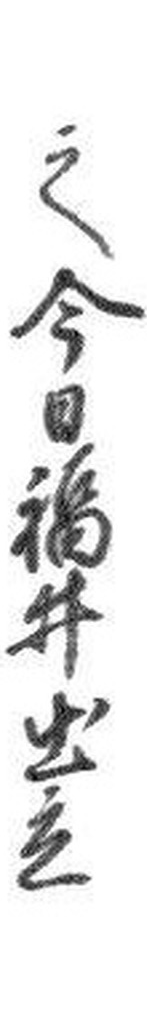之今日福井出立
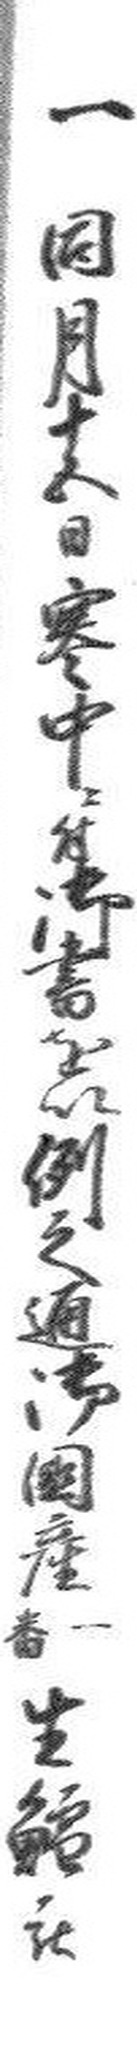一同月十五日寒中ニ付御書を以例之通御国産一番生鱈被
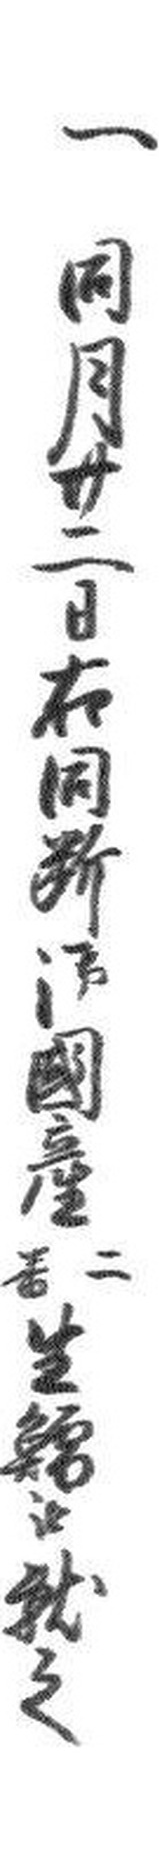一同月廿二日右同断御国産二番生鱈被献之
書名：家譜 七 光通公 従寛文四年到同九年
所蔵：福井県文書館 Fukui Prefectural Archives
